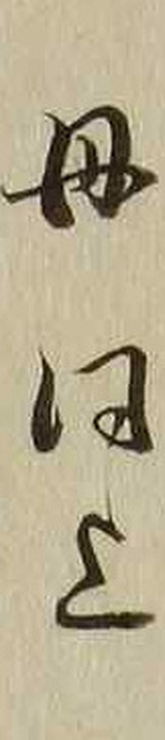母同上
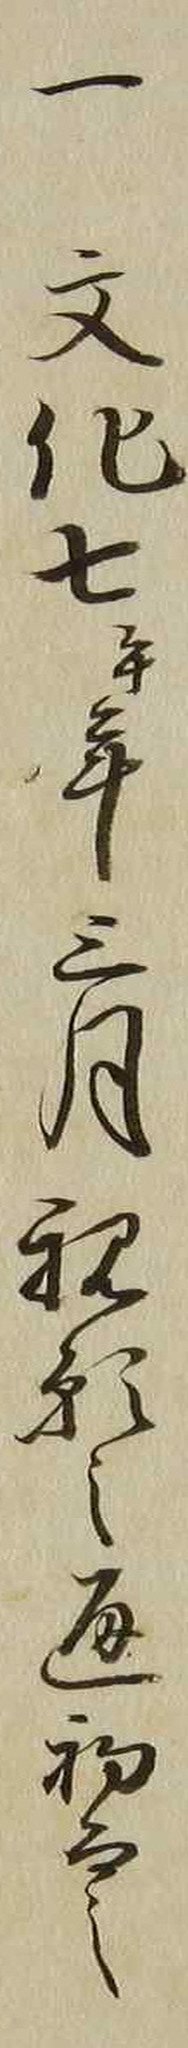一文化七午年三月親願之通初而之
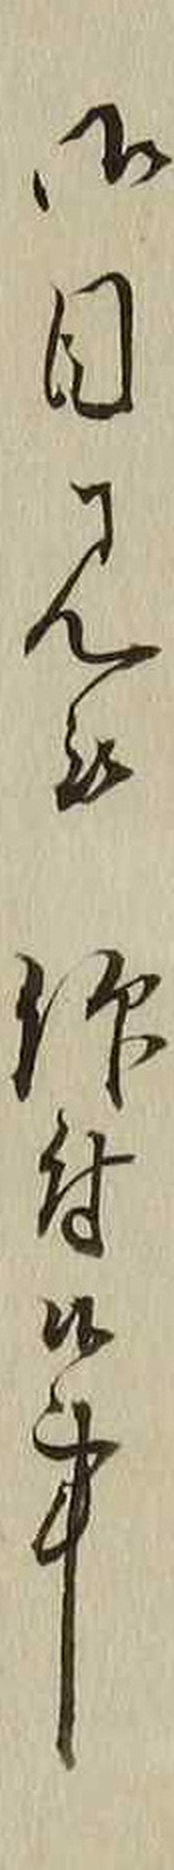御目見被仰付候事
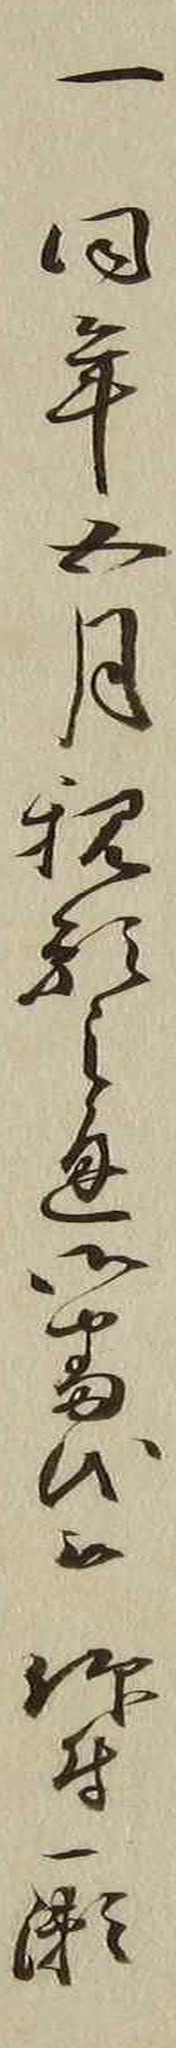一同年五月親願之通御番代被仰付一瀬
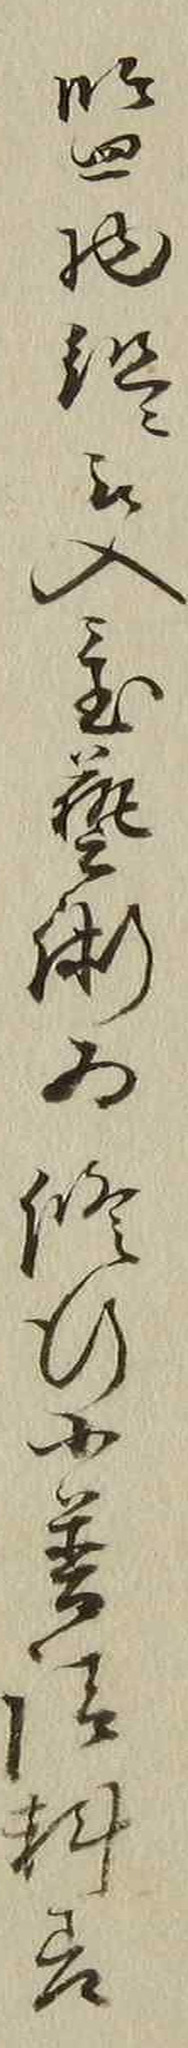監物組ニ被入置芸術為修行小普請料差
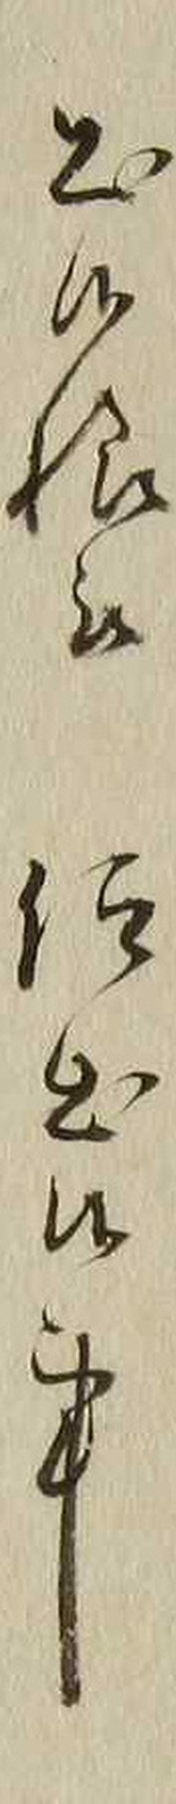出候様被仰出候事
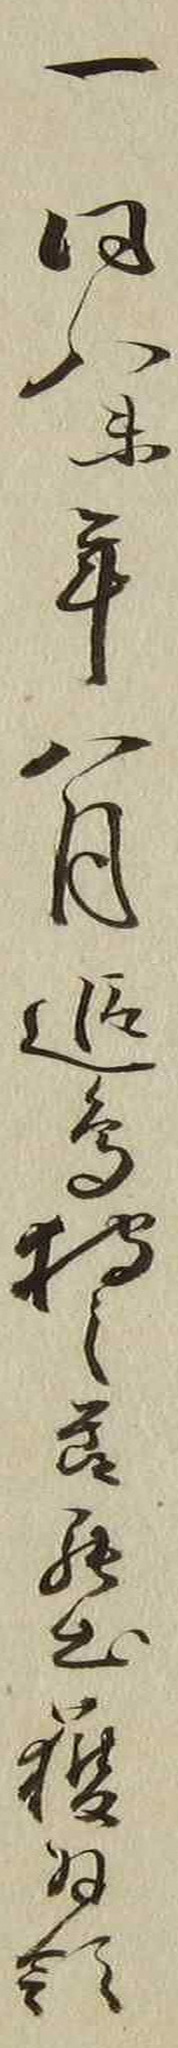一同八未年八月追鳥狩之節罷出獲拝領
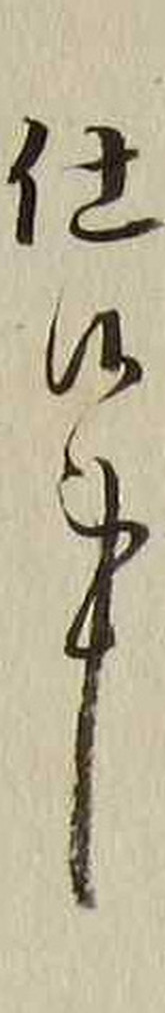仕候事
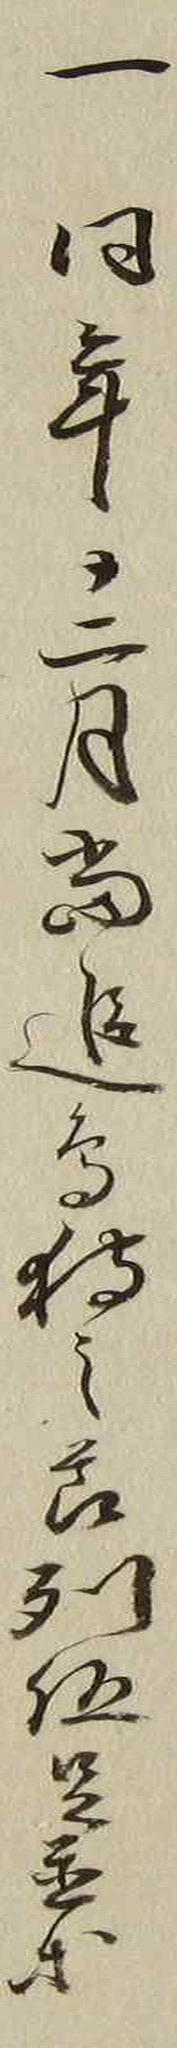一同年十二月当追鳥狩之節列伍足並等
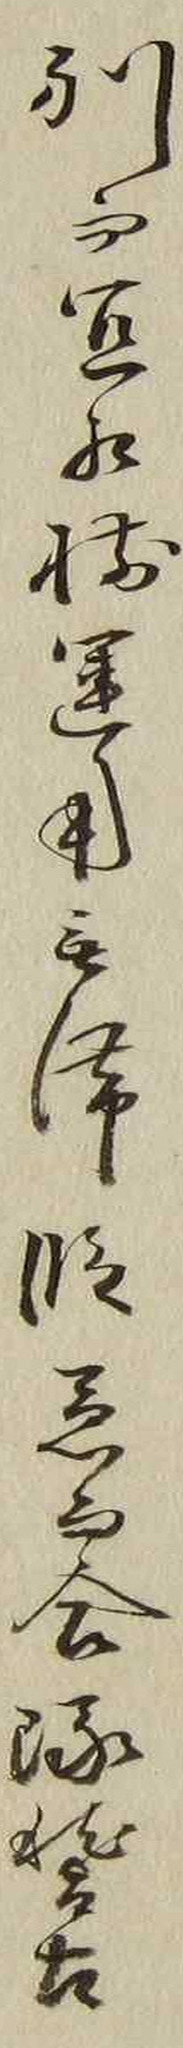別而宜相揃運用無滞段兼而合隊稽古
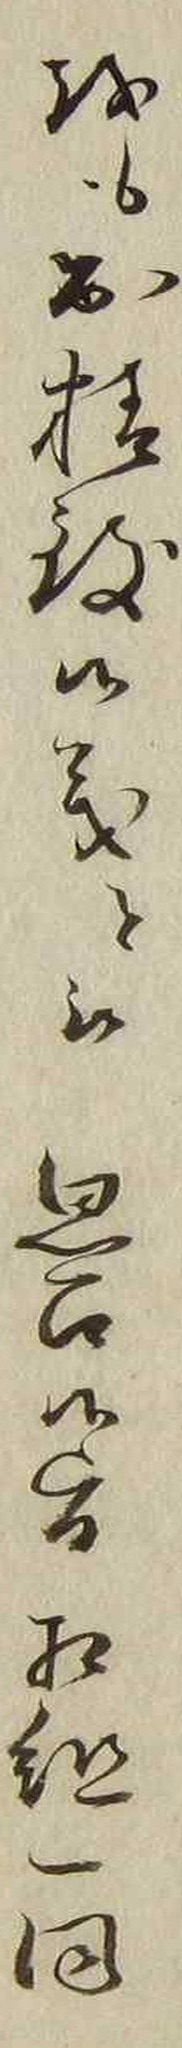をも出精致候義と被思召候旨相組一同
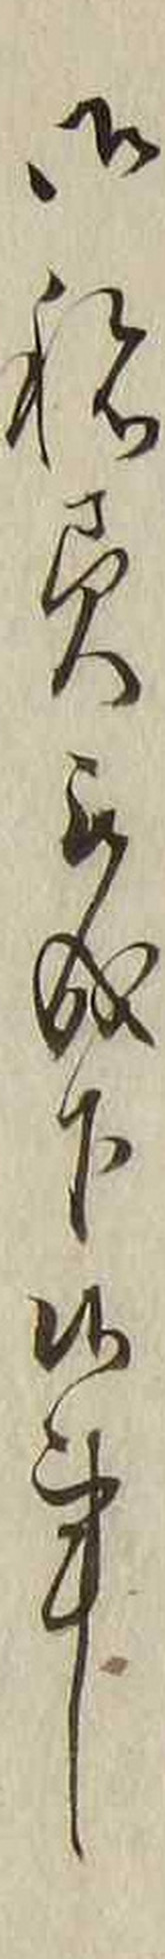御称美被成下候事

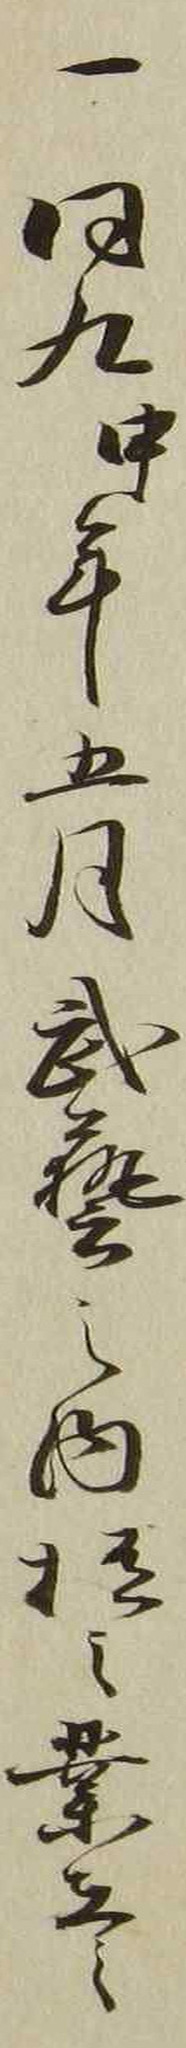一同九申年九月武芸之内極之業在之
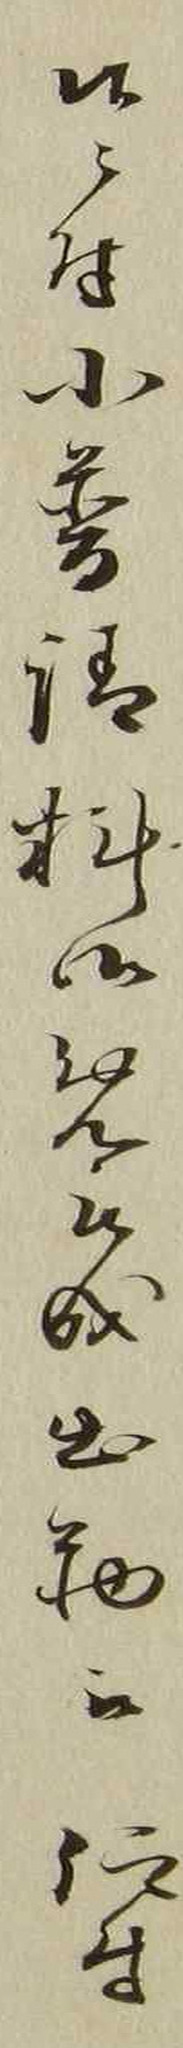候ニ付小普請御料御免被成出勤被仰付
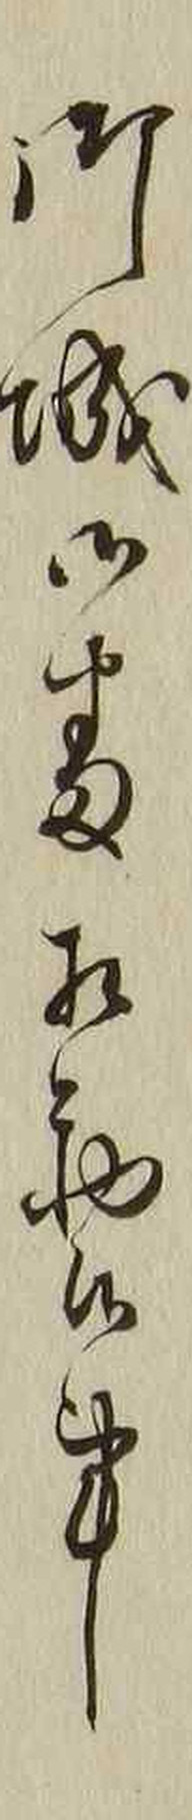御城御番相勤候事
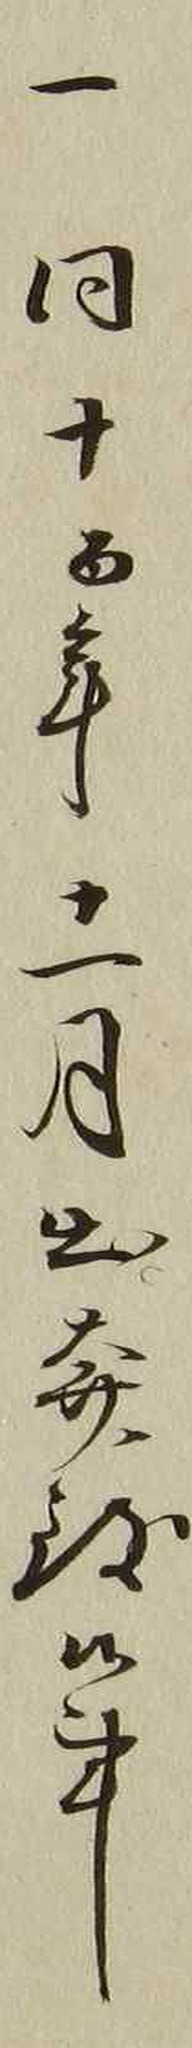一同十酉年十一月出奔致候事
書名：諸士系譜　巻之26　い之部26
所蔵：会津若松市立会津図書館
